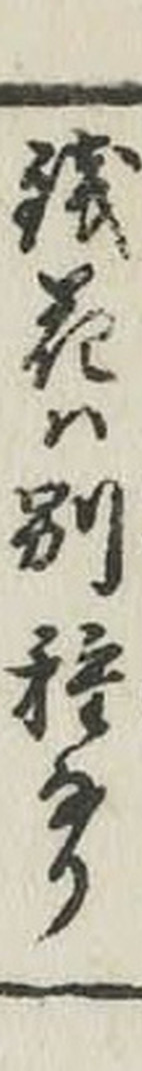銭花は別種なり
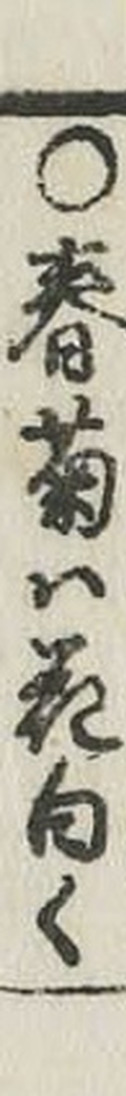○春菊は花白く
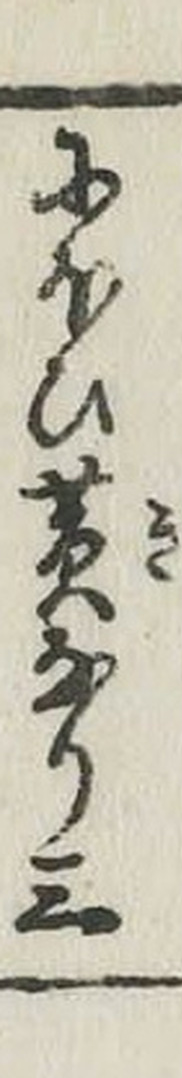にほひ黄なり三
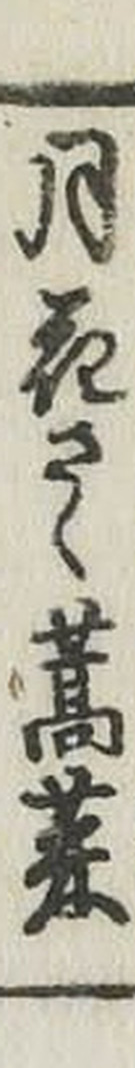月花さく蒿菜
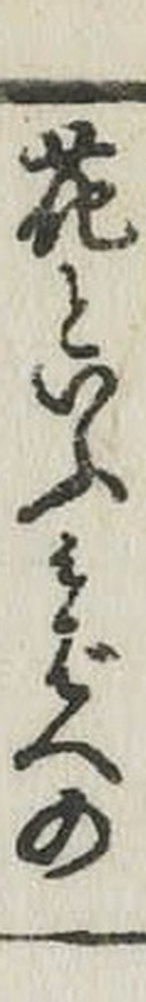花といふはだへの
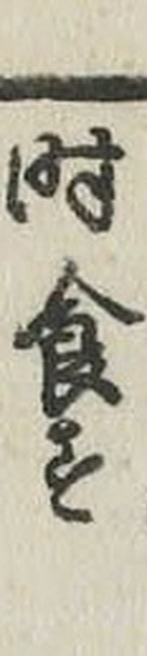時食す

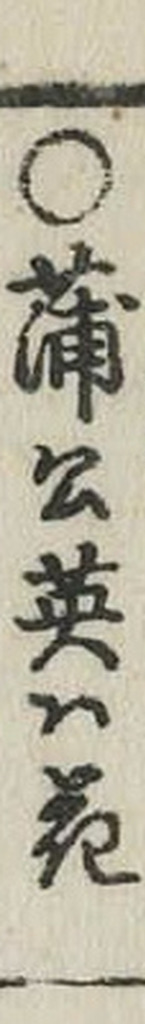○蒲公英は花
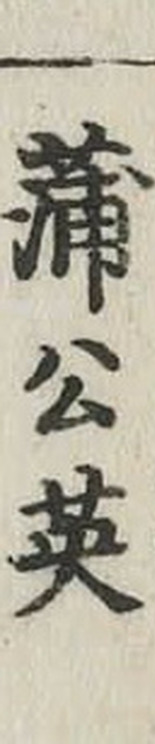蒲公英
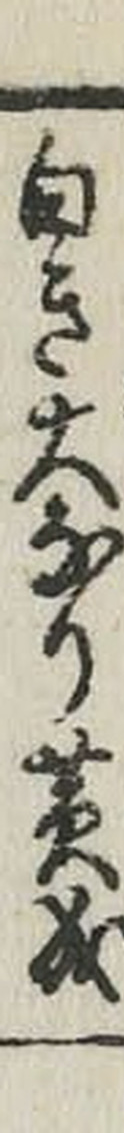白き大なり黄成
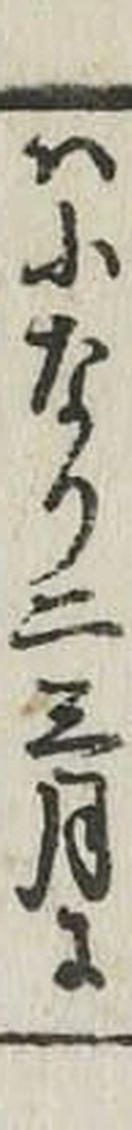は小なり二三月に
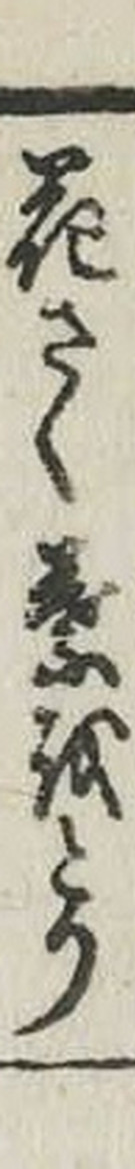花さく葉をとり
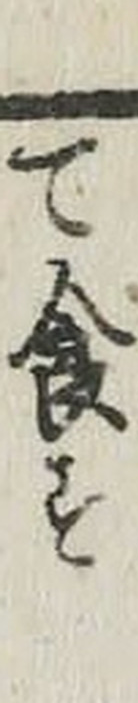て食す
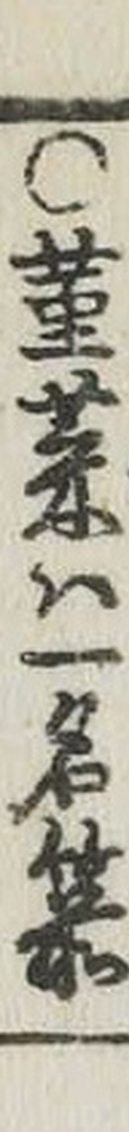○菫菜は一名箭
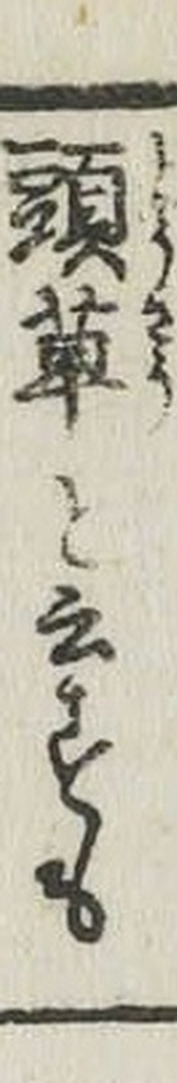頭草と云すも
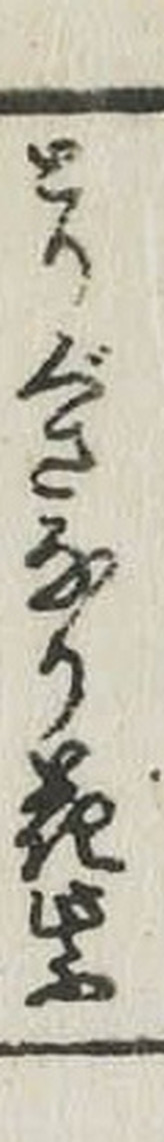とりぐさなり花紫
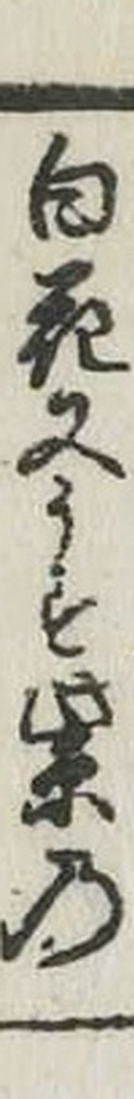白花又うす紫の
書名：増補頭書訓蒙図彙大成 10巻 9:巻之20
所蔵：東京学芸大学教育コンテンツアーカイブ
